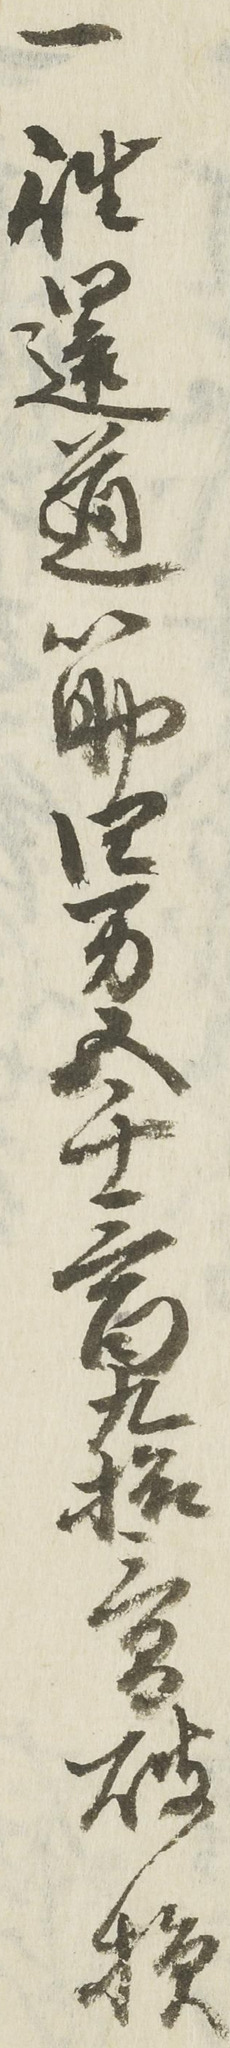一往還道筋四万五千三百九拾三間破損
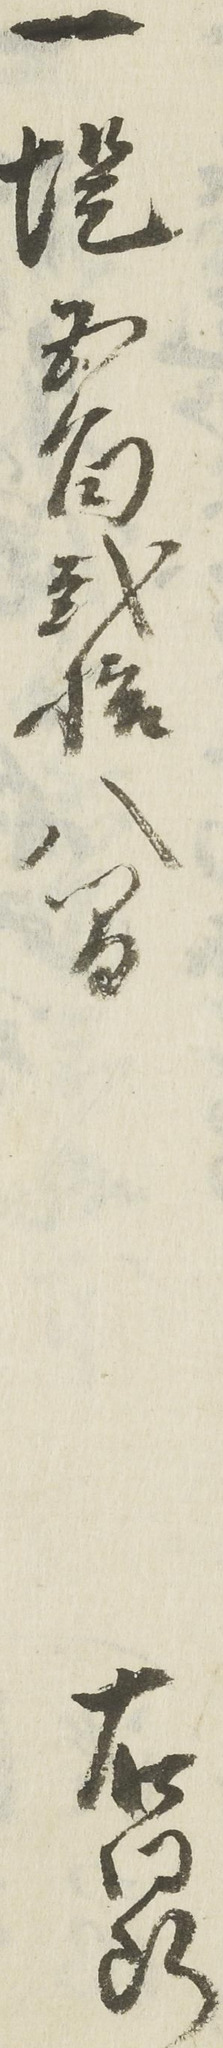一堤五百弐拾八間右同断
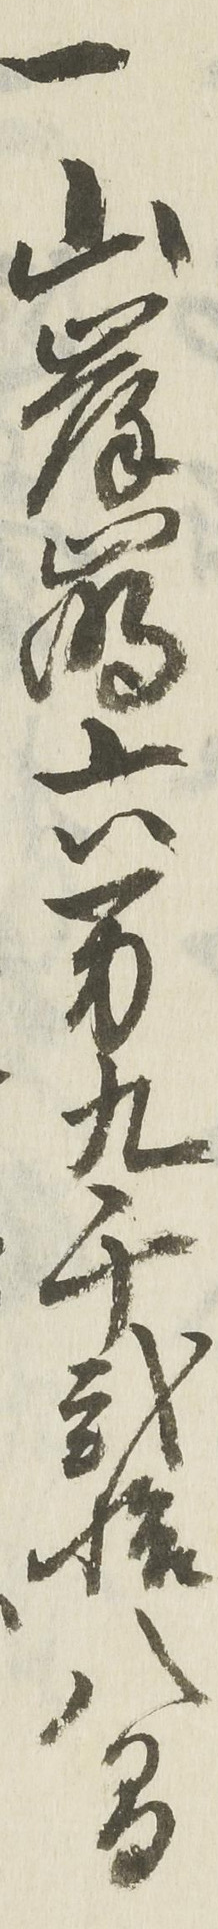一山岸崩六万九千弐拾八間
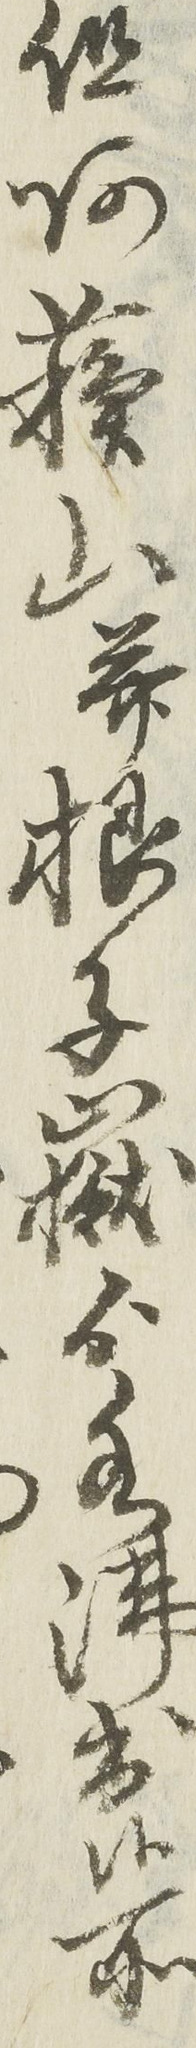但阿蘇山并根子岳ゟ水沸出候所
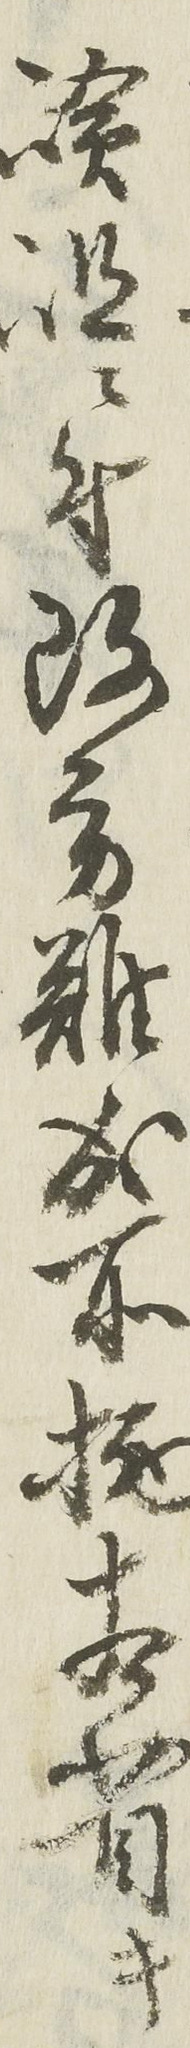嶮岨ニ付改方難成所柄相省キ
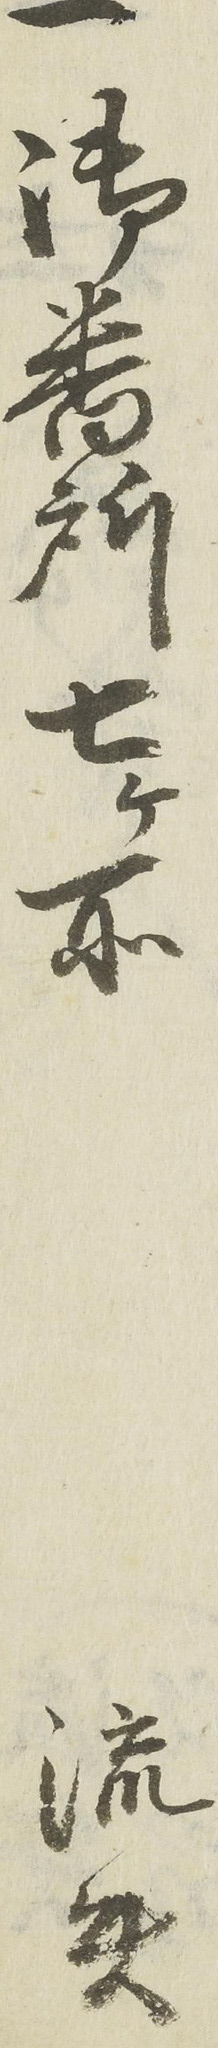一御番所七ケ所流失

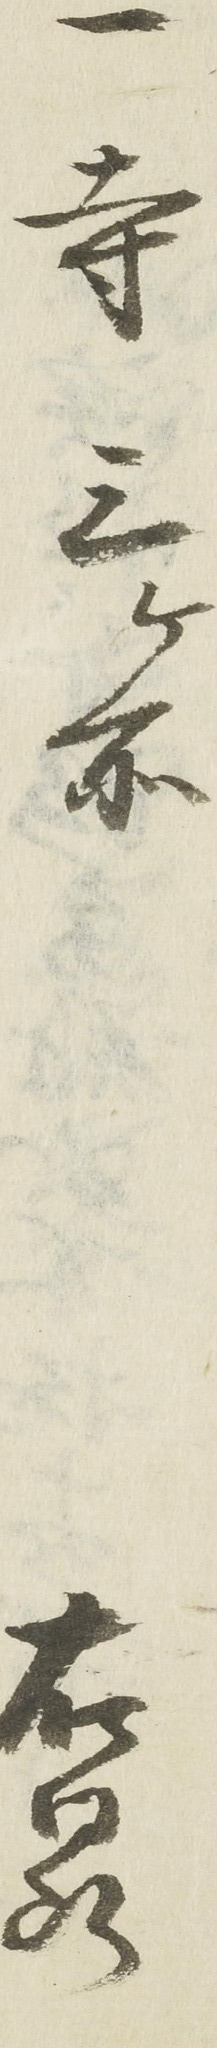一寺三ケ所右同断
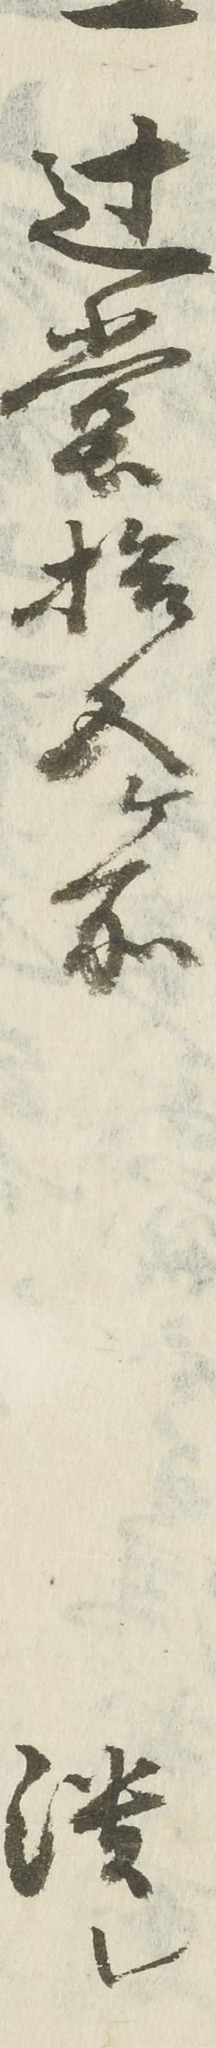一辻堂拾五ケ所潰レ
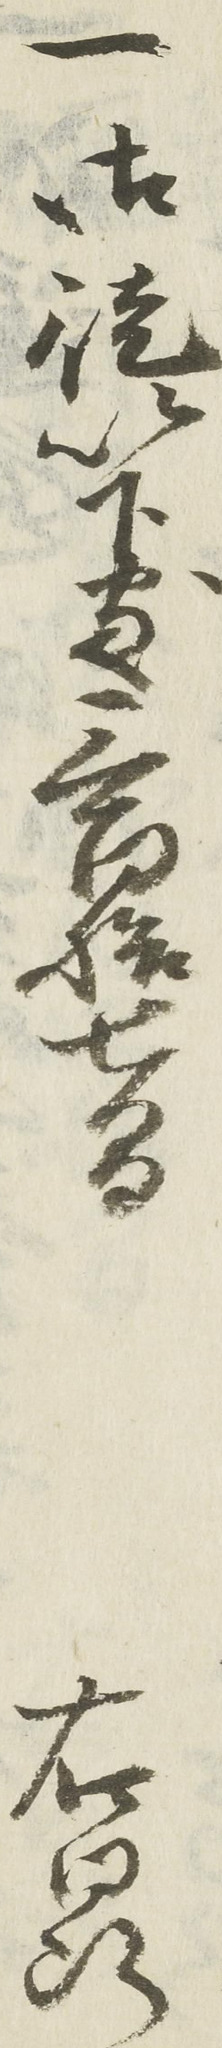一御徒以下家三百拾七間右同断
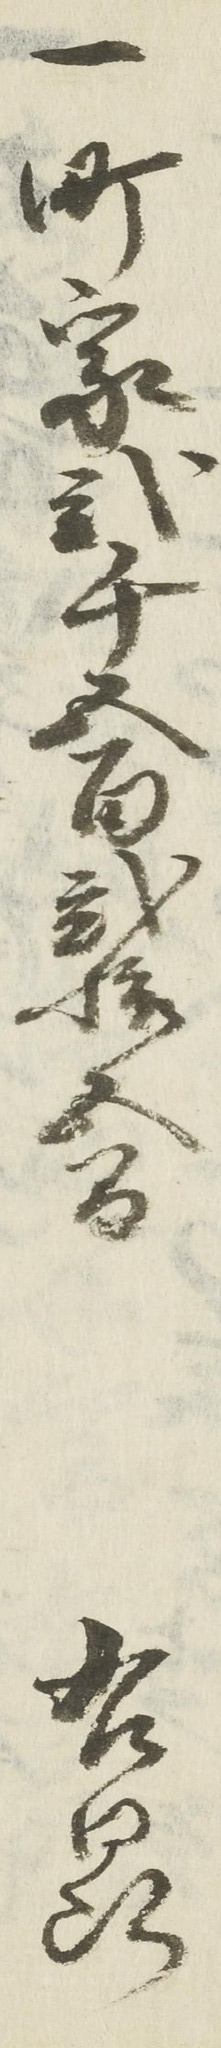一町家弐千五百弐拾五間右同断
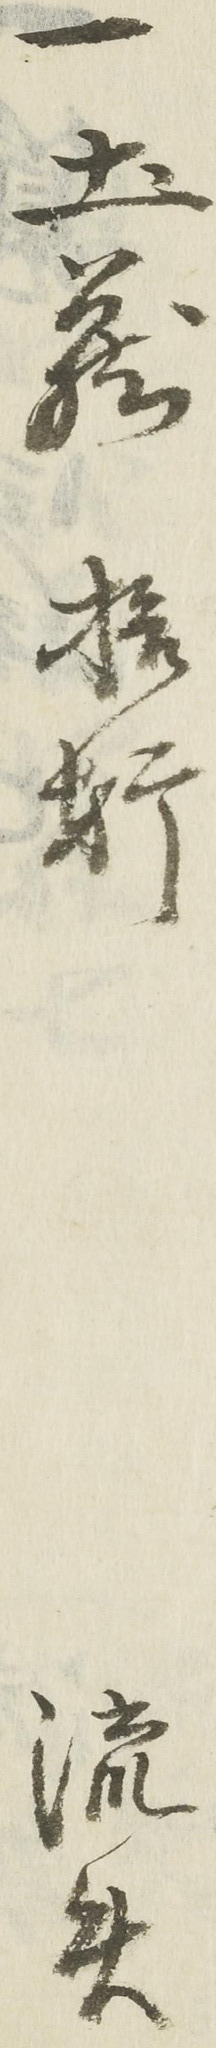一土蔵拾軒流失
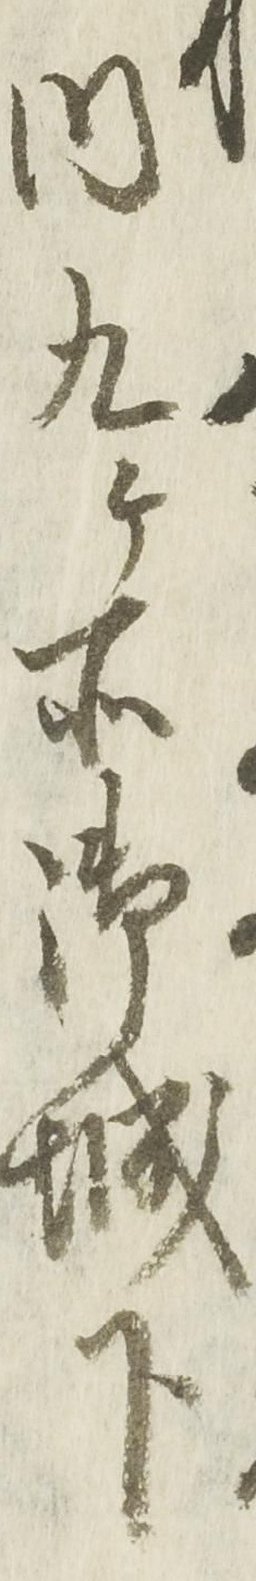内九ケ所御城下
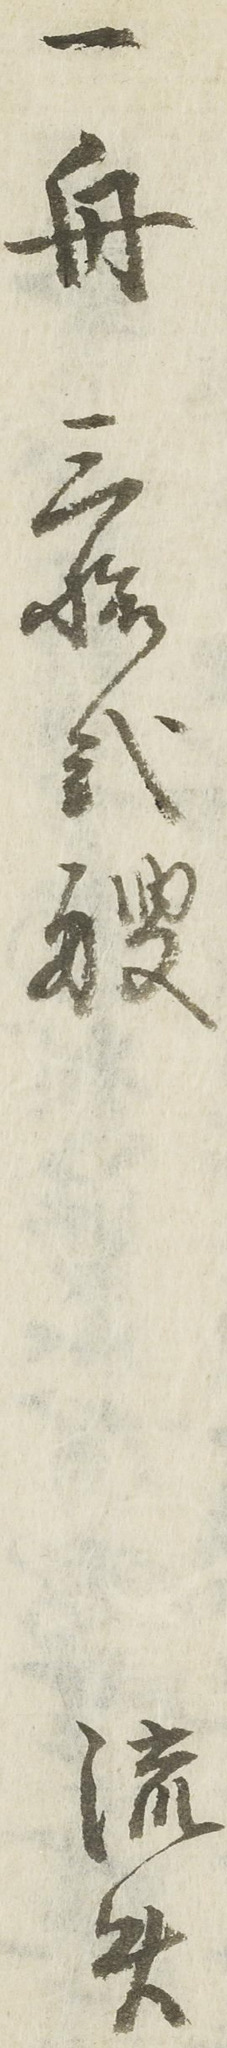一舟三拾弐艘流失
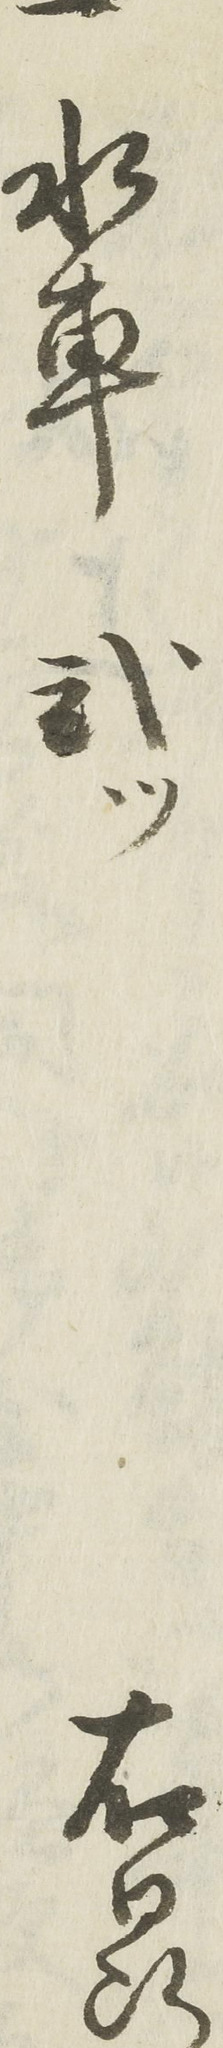一水車弐ツ右同断
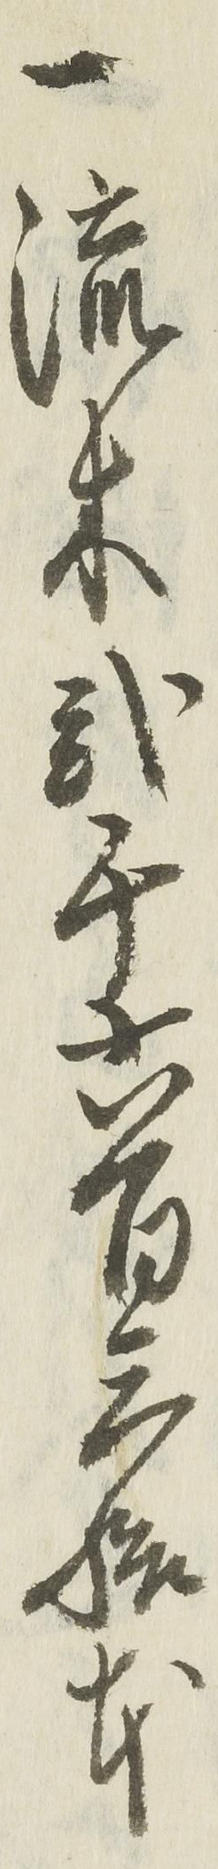一流木弐千六百三拾本
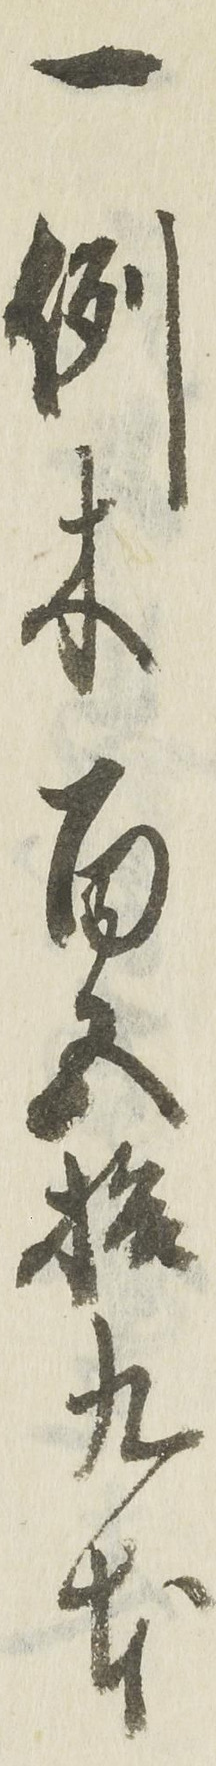一倒木百五十九本
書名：後見笑
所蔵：東京大学地震研究所図書室 Earthquake Research Institute Library, The University of Tokyo, JAPAN
